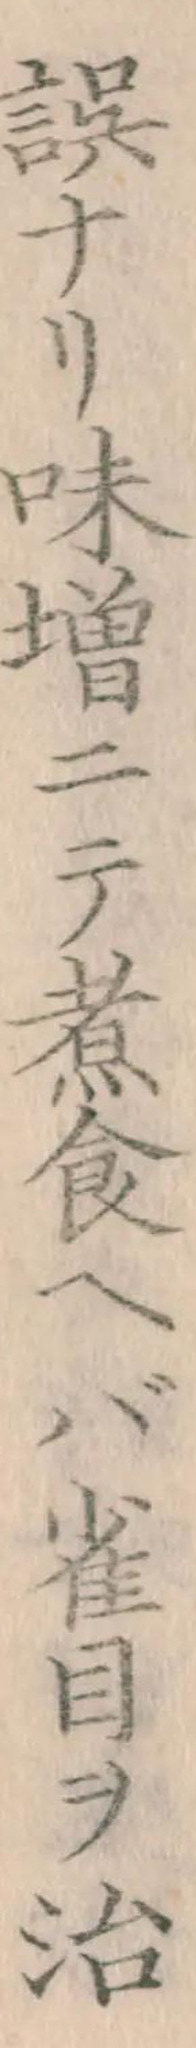誤ナリ味噌ニテ煮食ヘバ雀目ヲ治
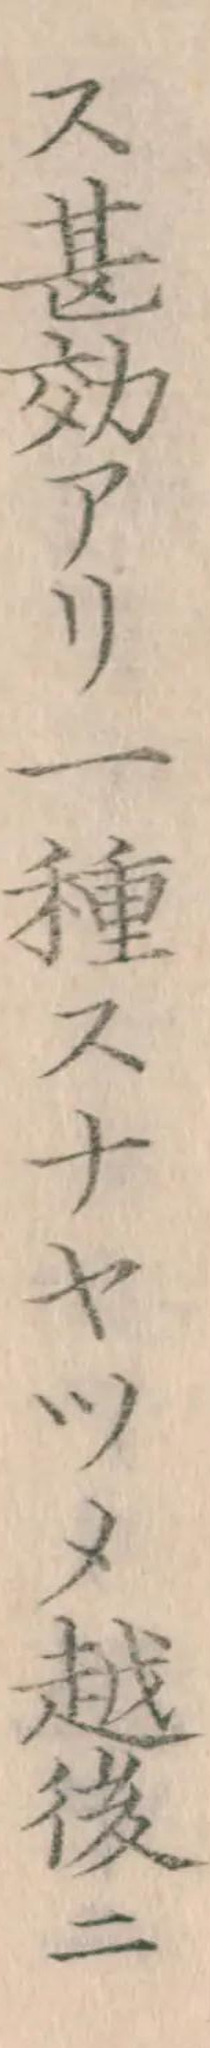ス甚効アリ一種スナヤツメ越後ニ
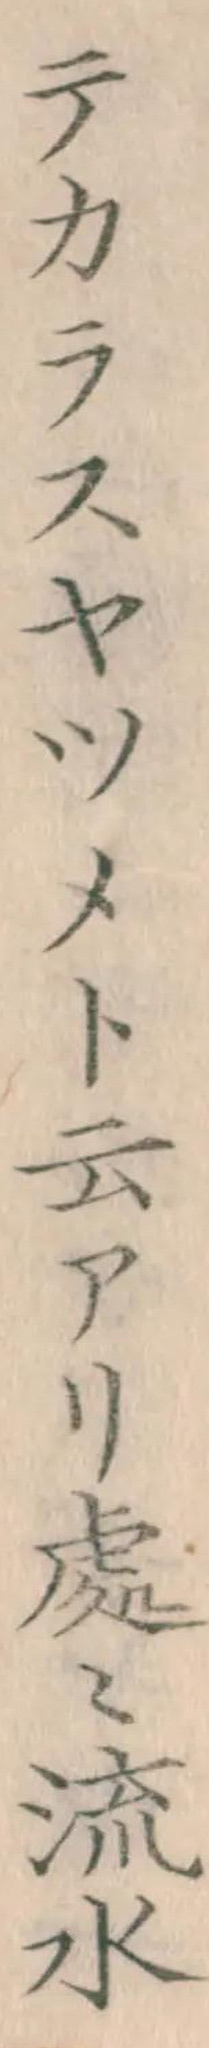テカラスヤツメト云アリ処ゝ流水
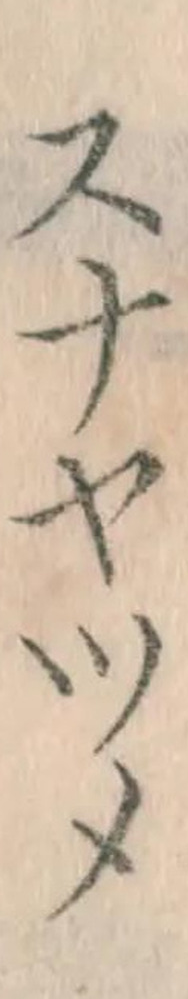スナヤツメ
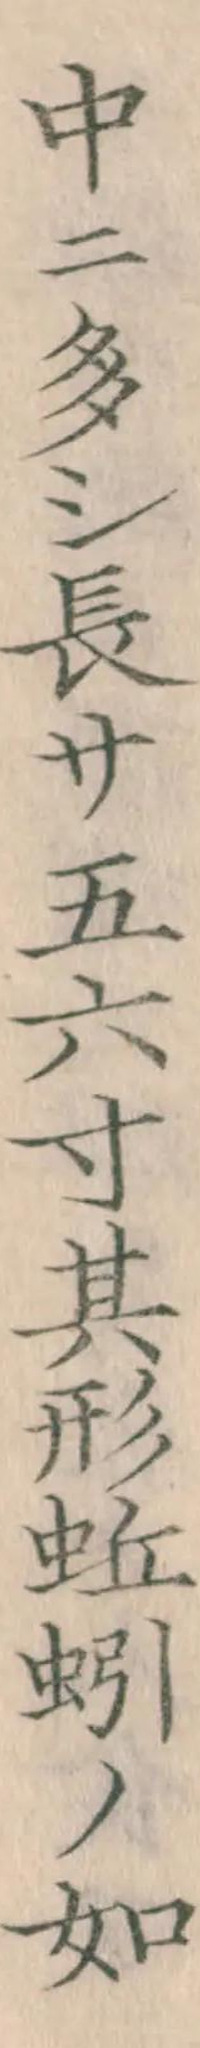中ニ多シ長サ五六寸其形蚯蚓ノ如

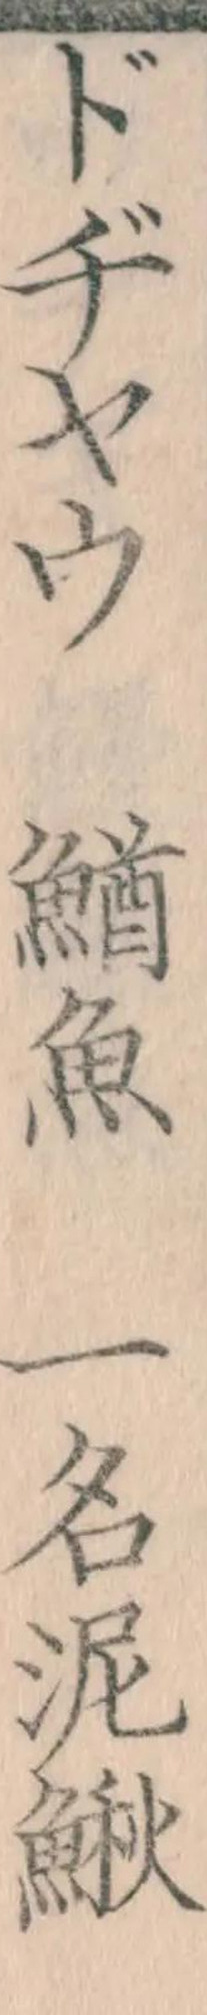ドヂヤウ鰌魚一名泥鰍
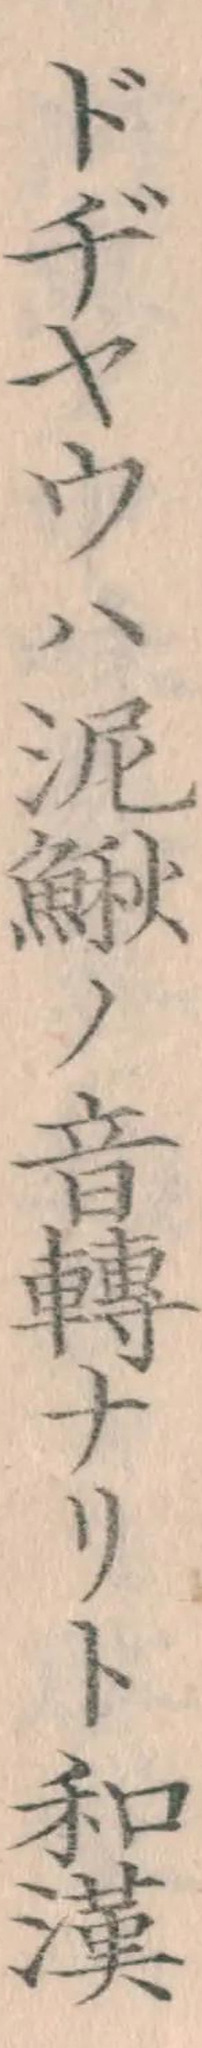ドヂヤウハ泥鰍ノ音転ナリト和漢
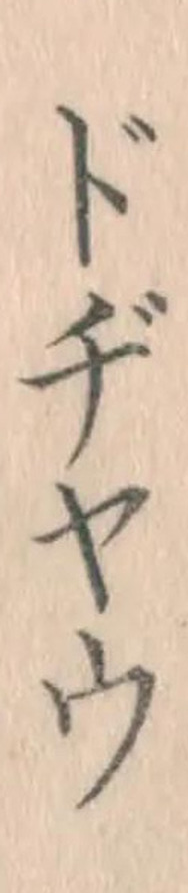ドヂヤウ
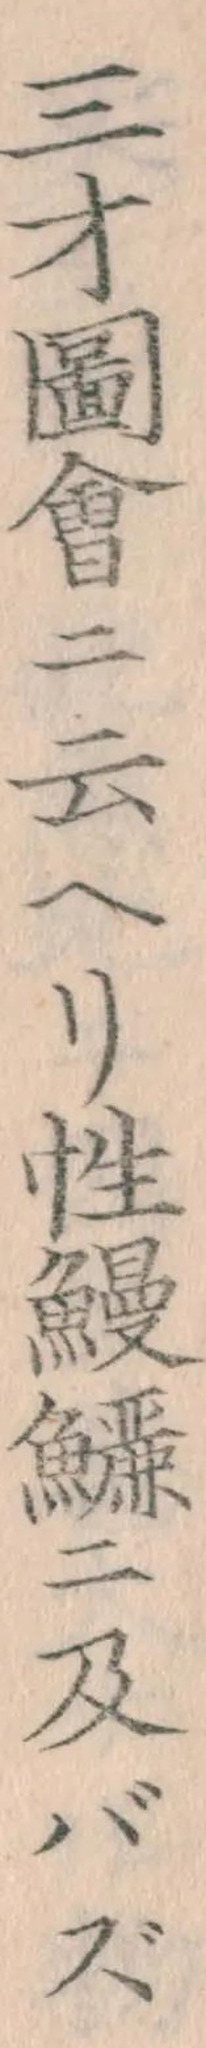三才図会ニ云ヘリ性鰻鱺ニ及バズ
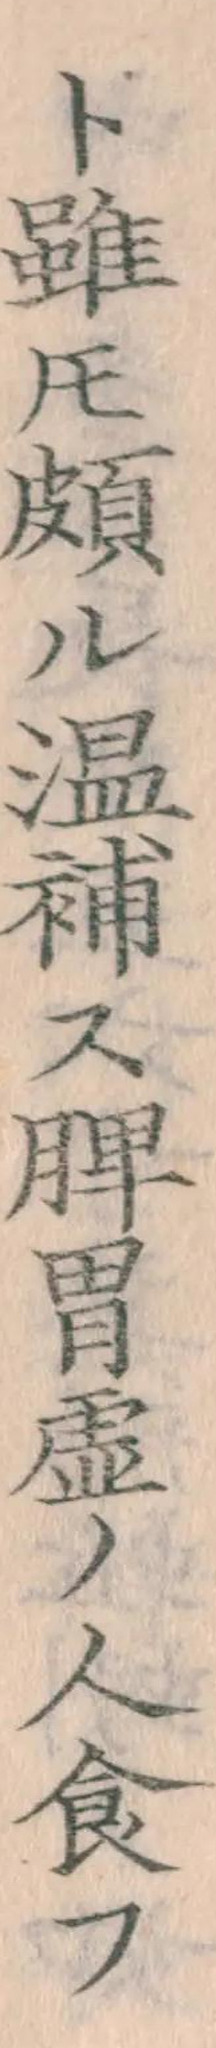ト雖トモ頗ル温補ス脾胃虚ノ人食フ
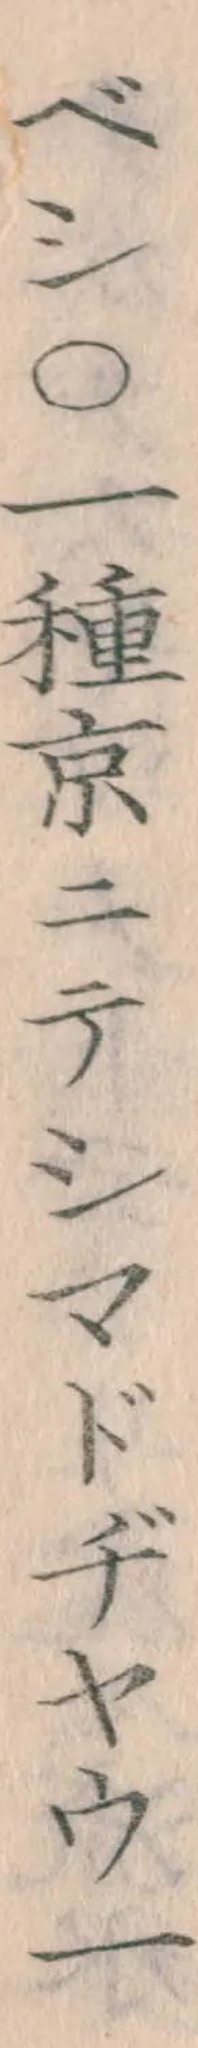ベシ〇一種京ニテシマドヂヤウ一
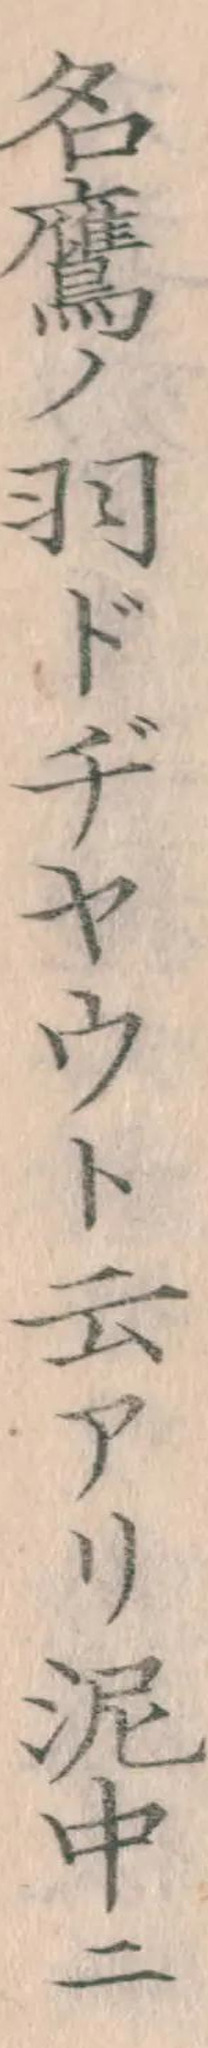名高鷹ノ羽ドヂヤウト云アリ泥中ニ
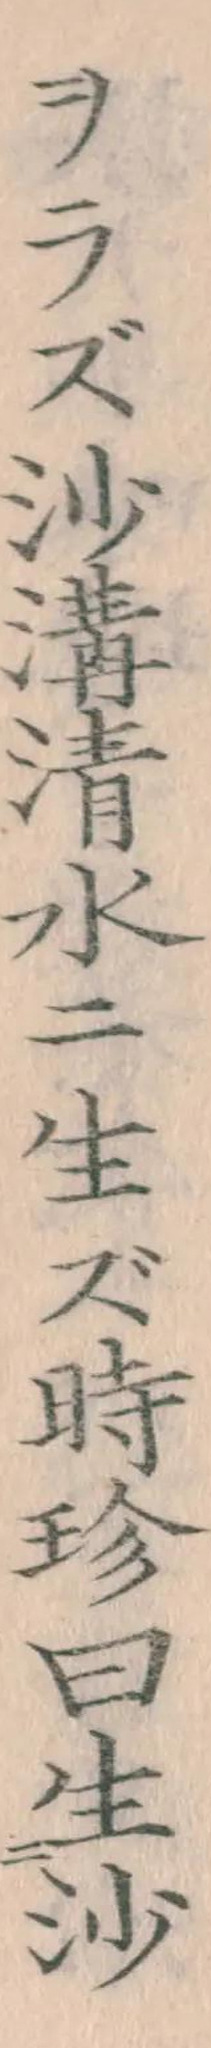ヲラズ沙溝清水ニ生ズ時珍曰生沙
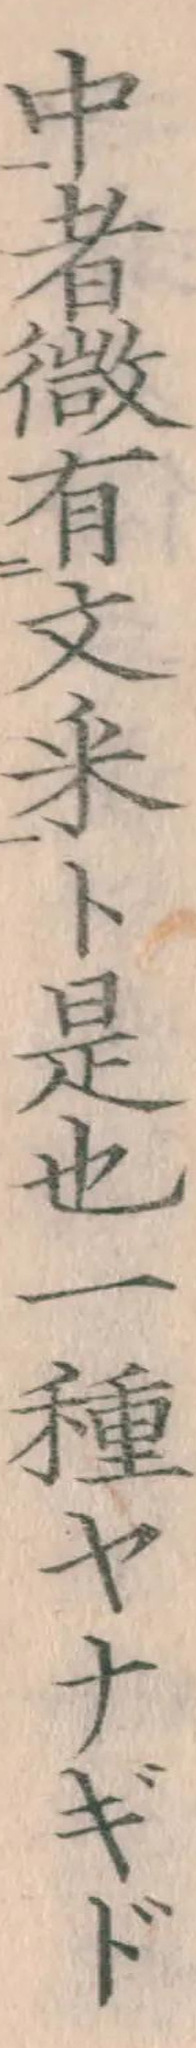中者微有文釆ト是也一種ヤナギド
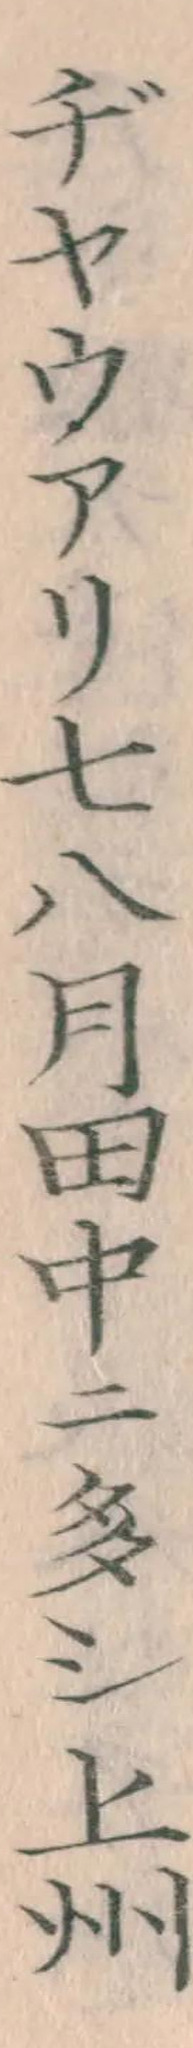ヂヤウアリ七八月田中ニ多シ上州
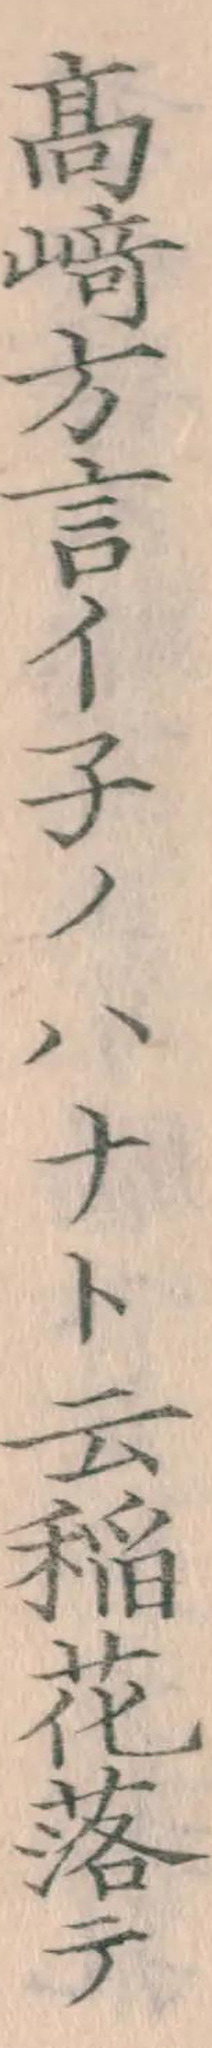高崎方言イネノハナト云稲花落テ
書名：皇和魚譜 2巻
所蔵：国立国会図書館 National Diet Library, JAPAN
